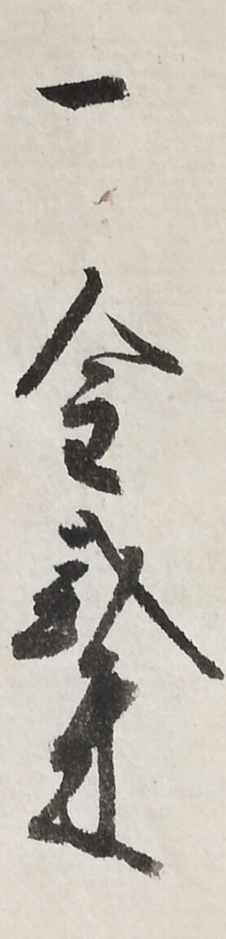一金弐朱清蔵
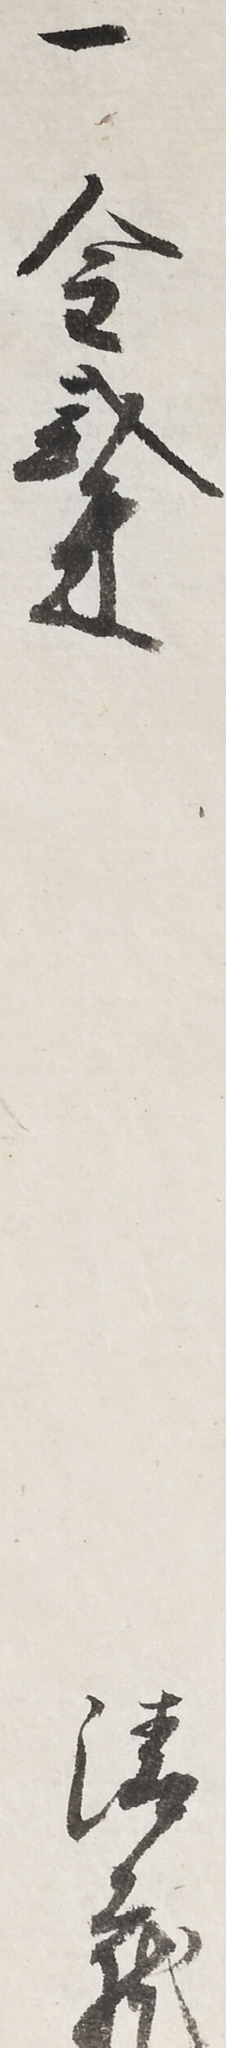一金弐朱清蔵
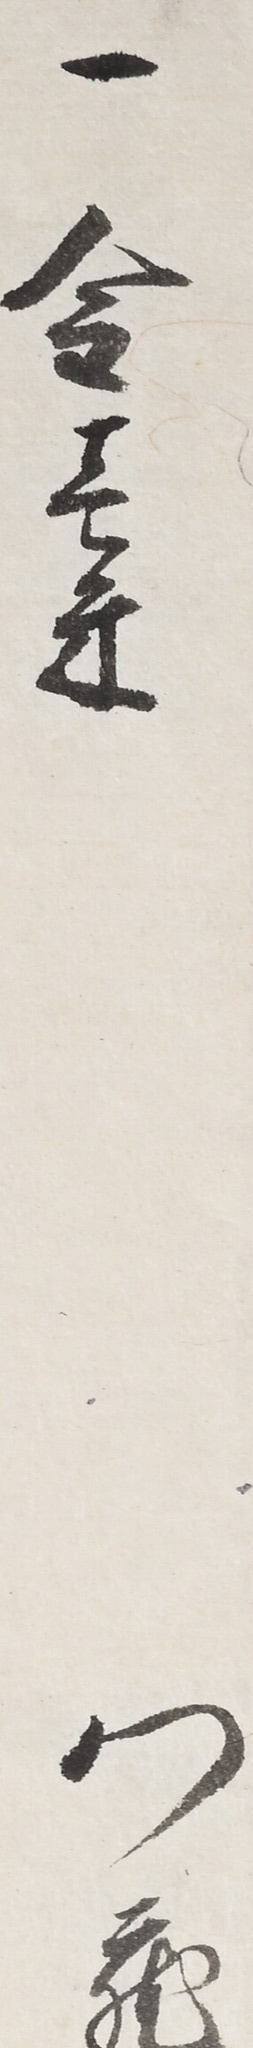一金壱朱門蔵
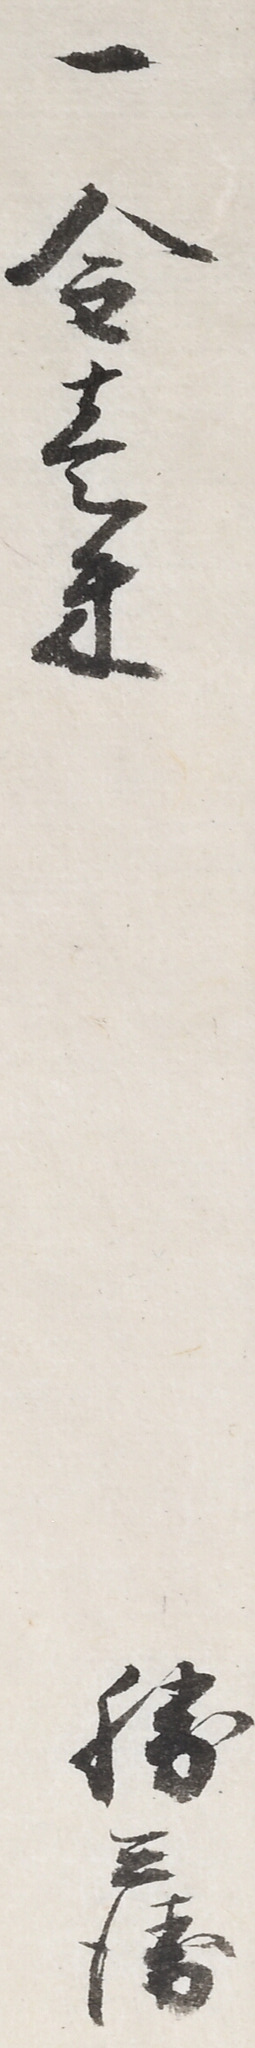一金壱朱勝兵衛
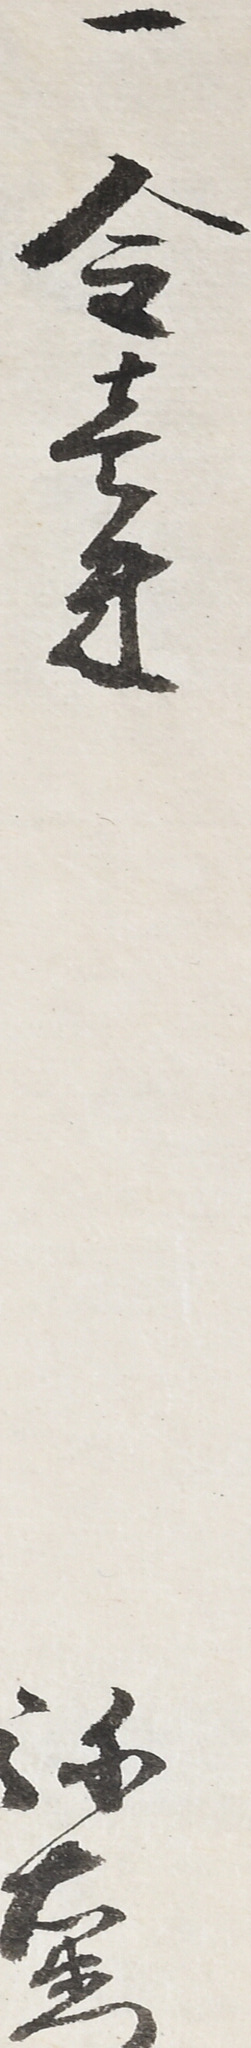一金壱朱弥右衛門
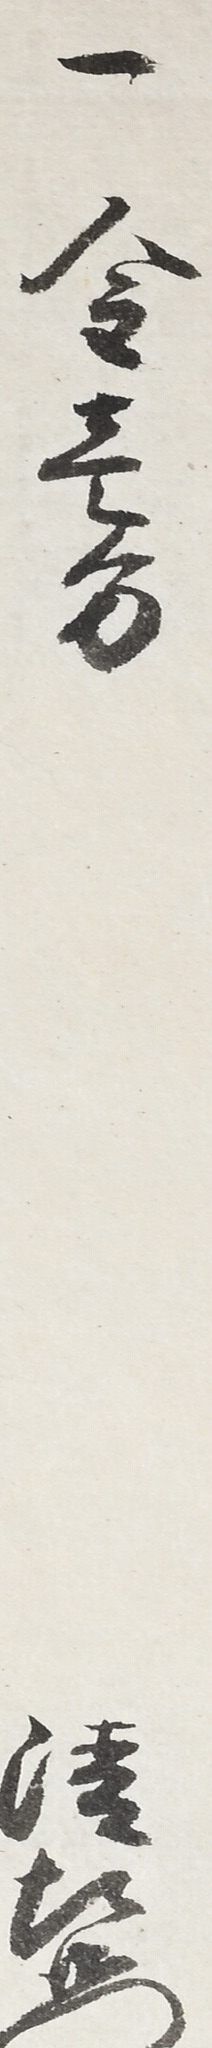一金壱分清左衛門
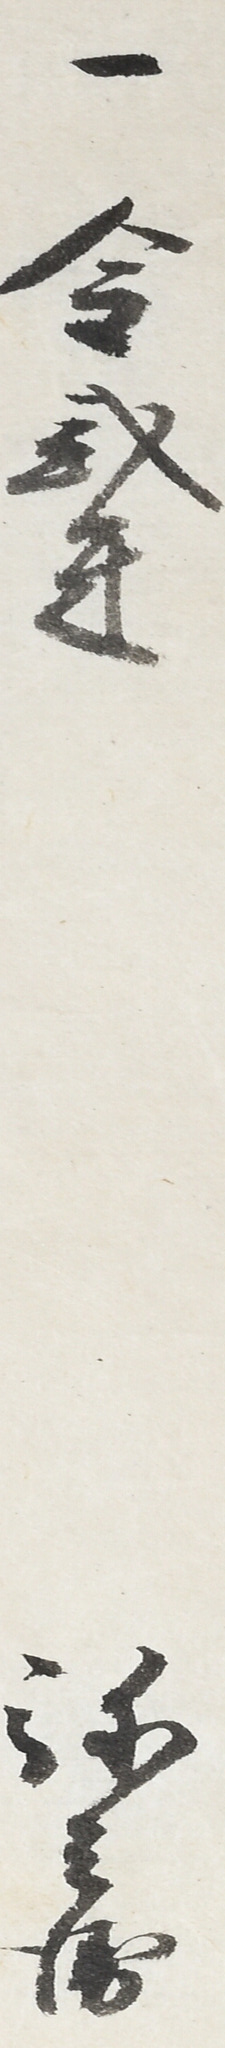一金弐朱弥兵衛

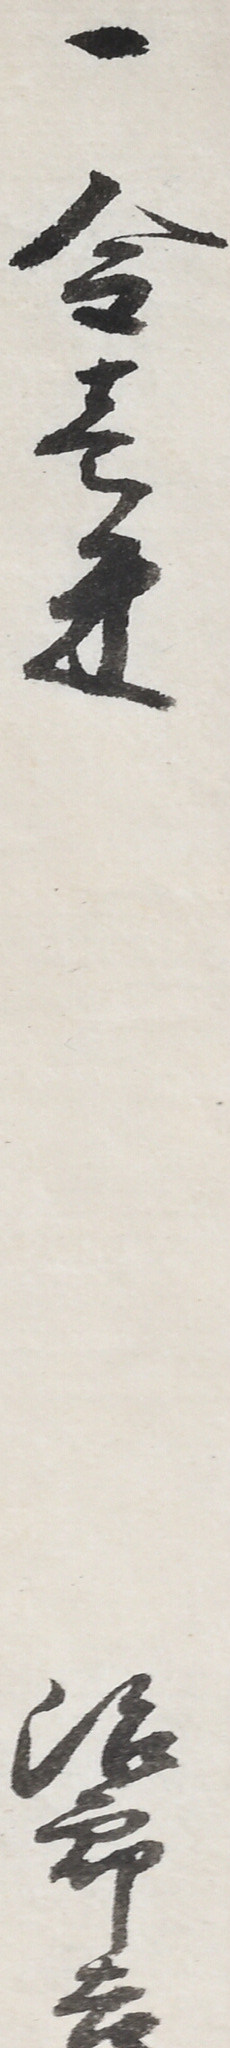一金壱朱治郎吉
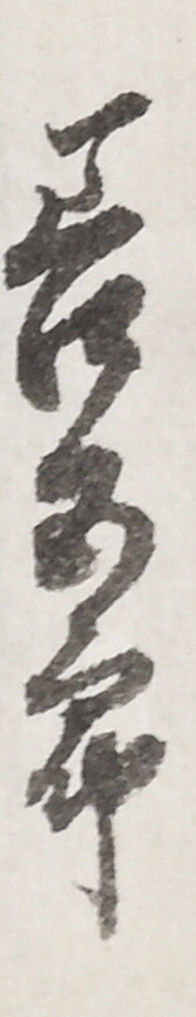善五郎
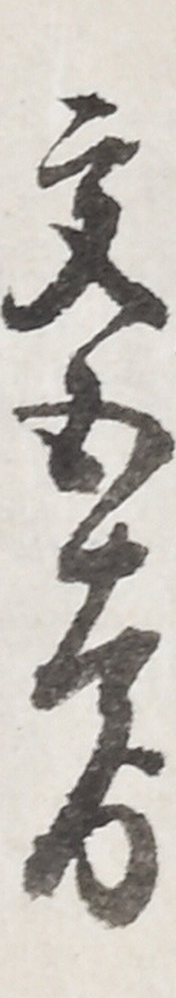文五右衛門
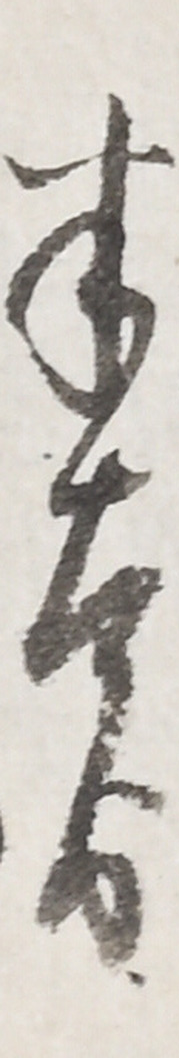半右衛門
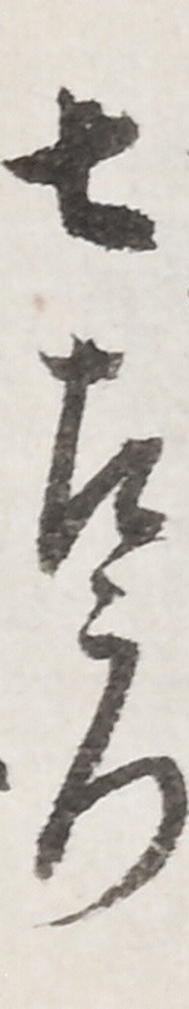七左衛門
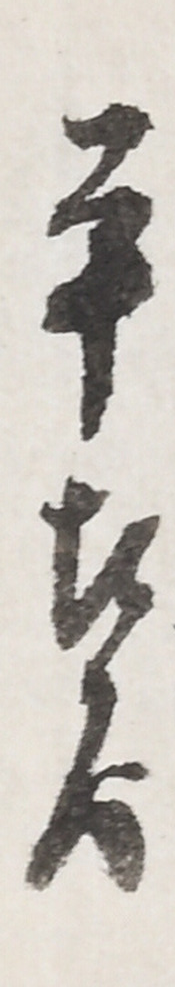平左衛門
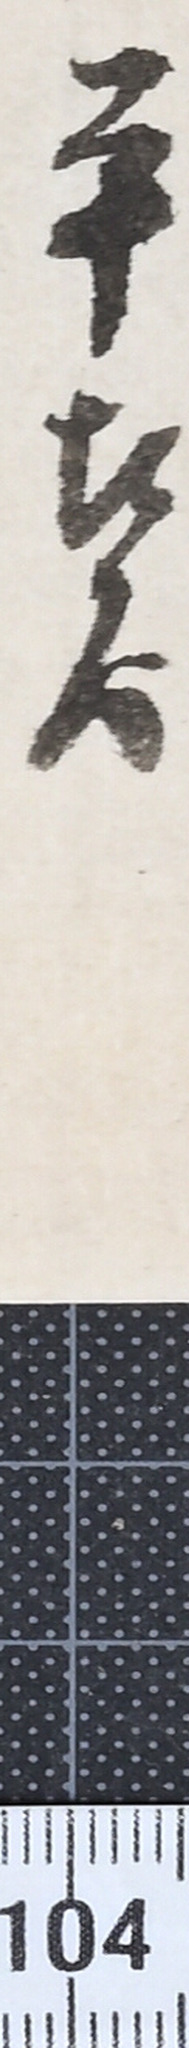平左衛門
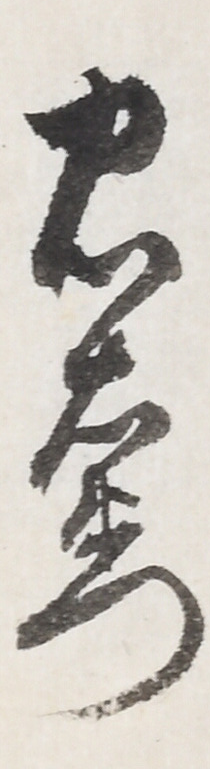半右衛門
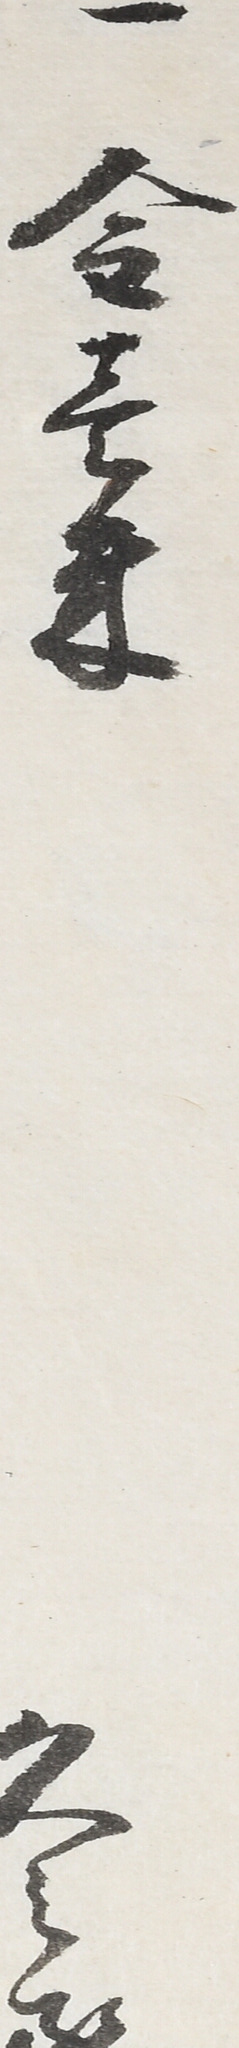一金壱朱久之丞
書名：御拝地百五拾年御祝儀献上御目録名前
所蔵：伊那市立高遠町図書館・合同会社AMANE
